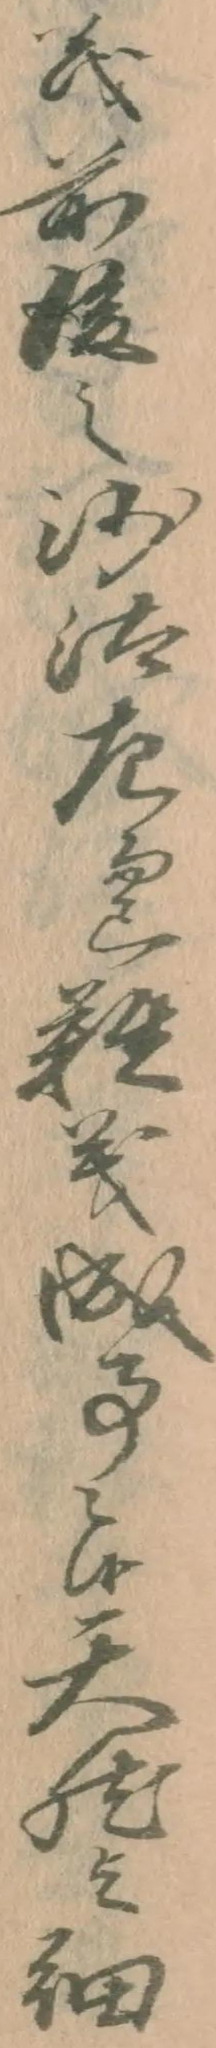茂前後之沙汰左而己難義成事に候天然与細
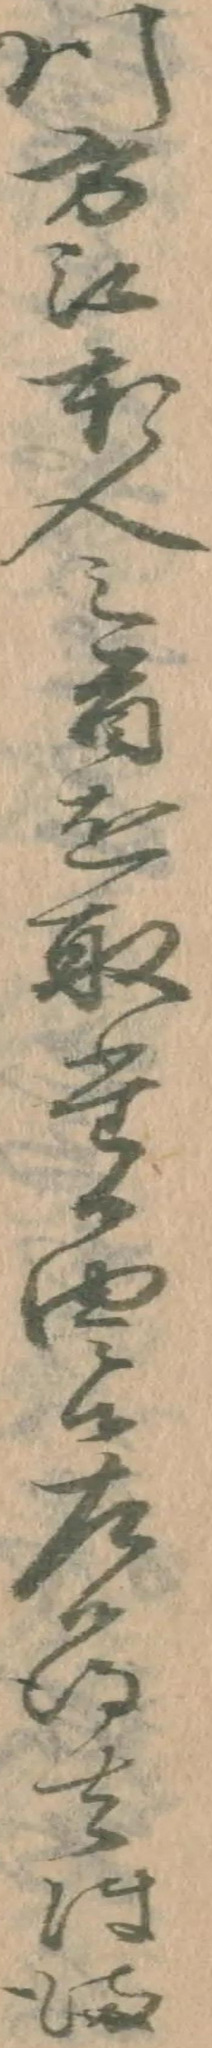川方江本人之首を取堂る由に候左候得者ほ満
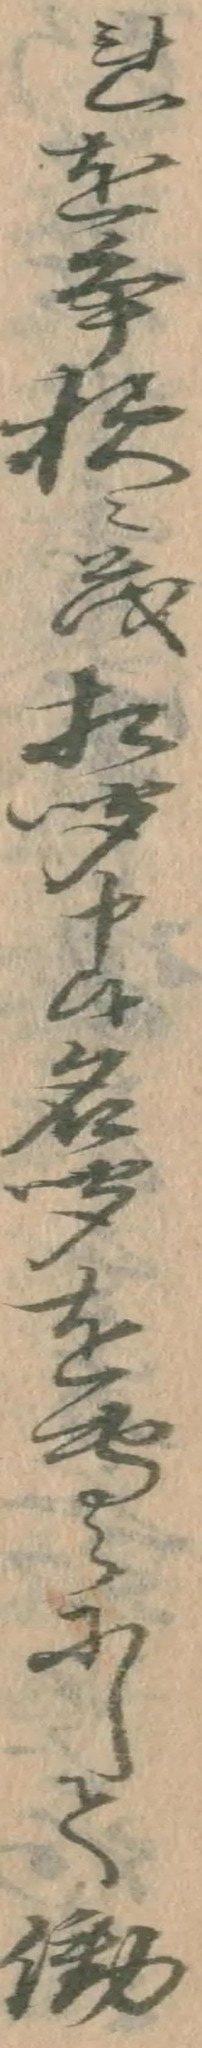連を争様に茂相聞申候名聞を専ら尓して働
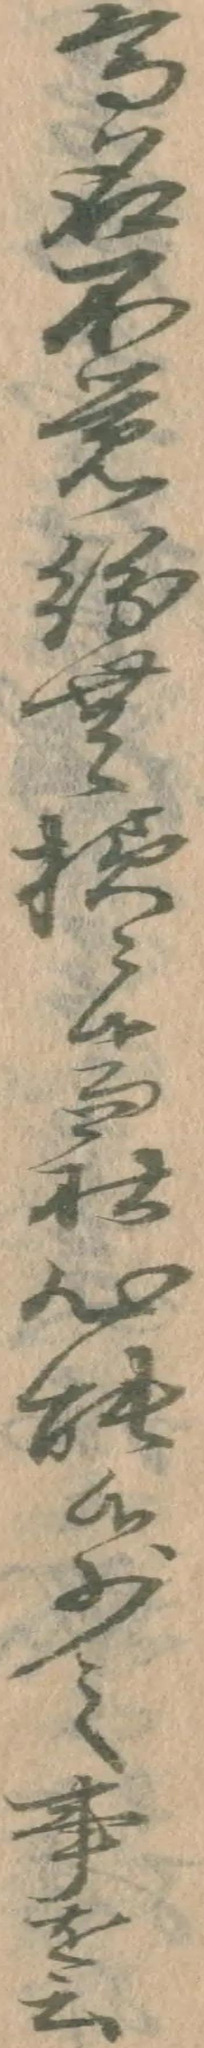高名不覚紛無様に候而被心能候少之事を云
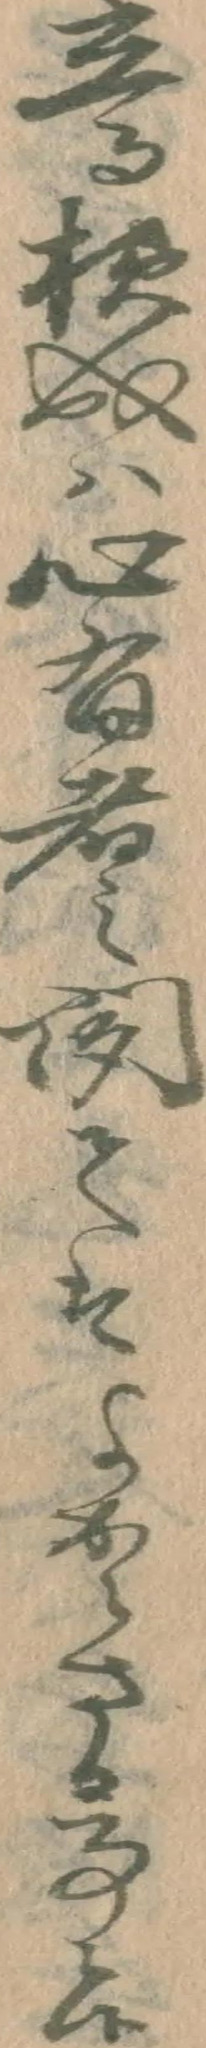立る様成は心有者之聞て盤よからさる事に候
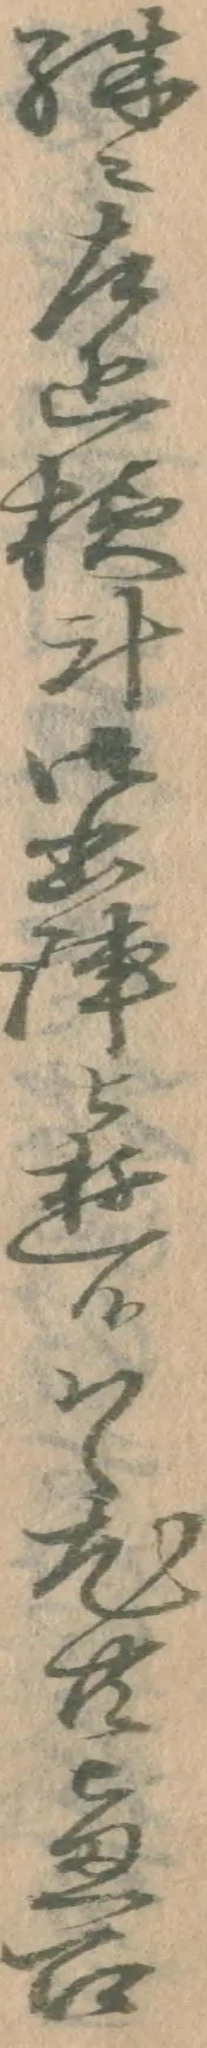殊に左近様斗御出陣被遊候はゝ尤共被思召
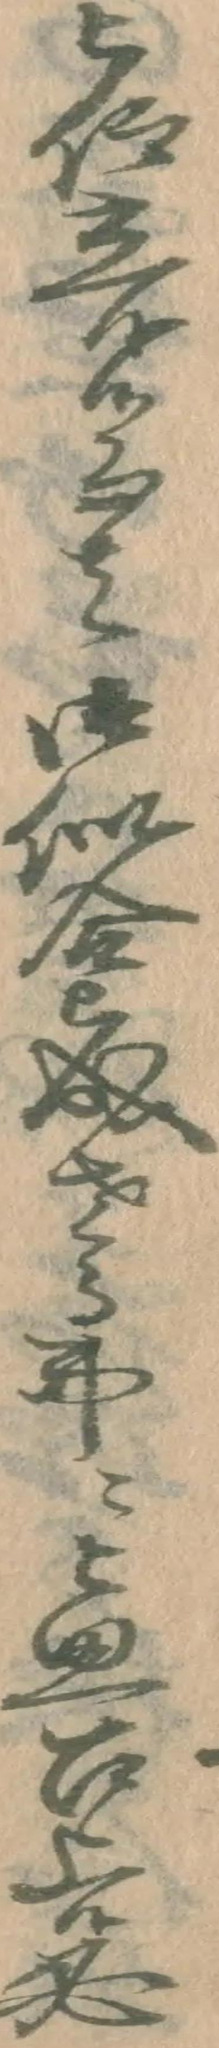被仰立候而者御似合被成さる事に与思召上候必
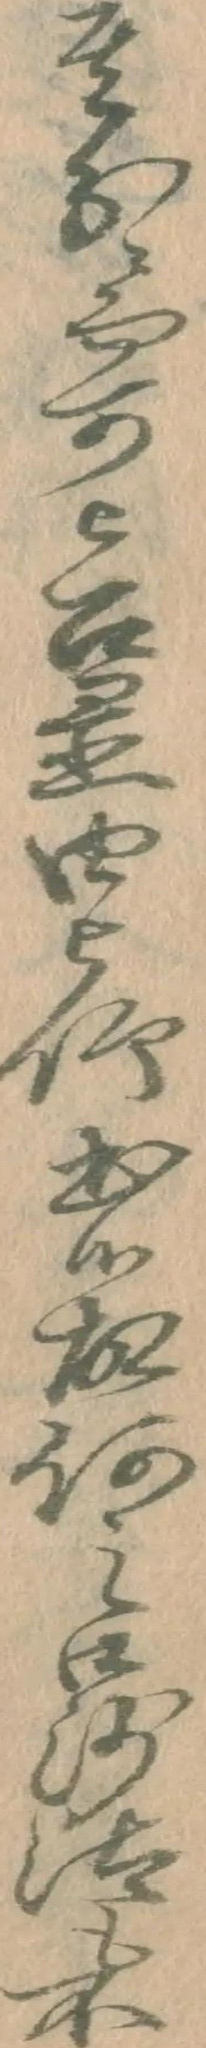其分に而可被召置由被仰出候故何之御沙汰も不

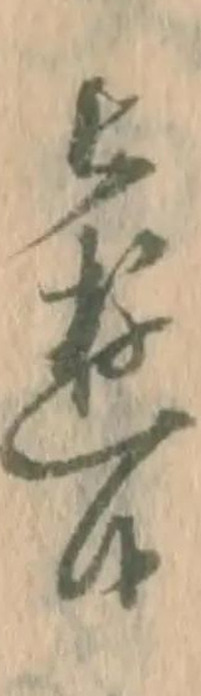被遊候
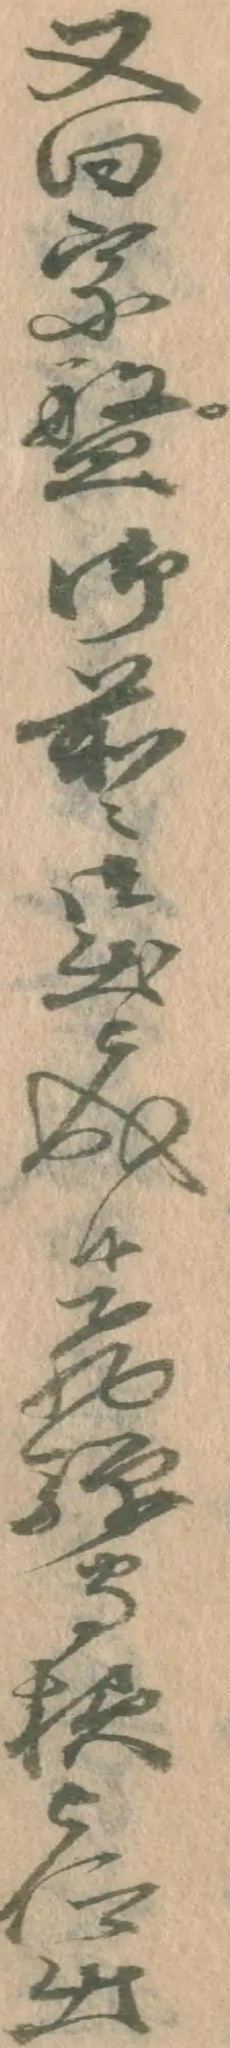又曰宗盤御前に御出被成候飛騨守様被仰出
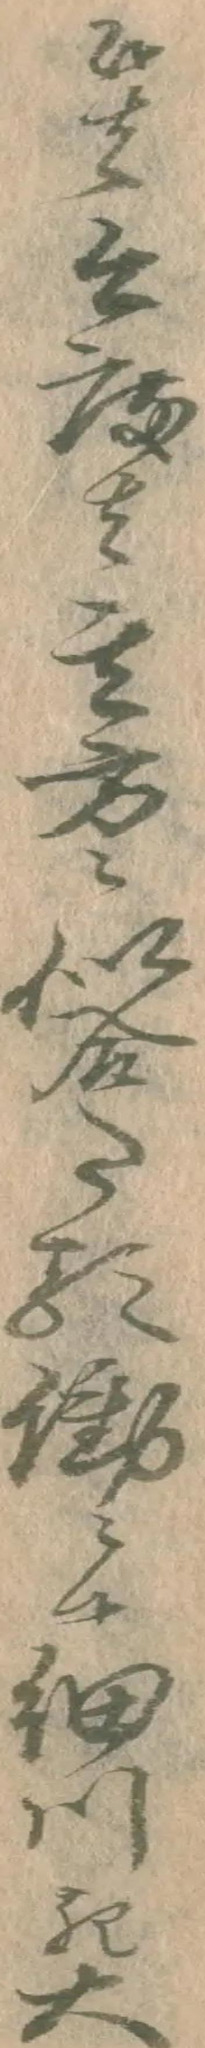候者今度者其方に似合た類働に候細川歟大
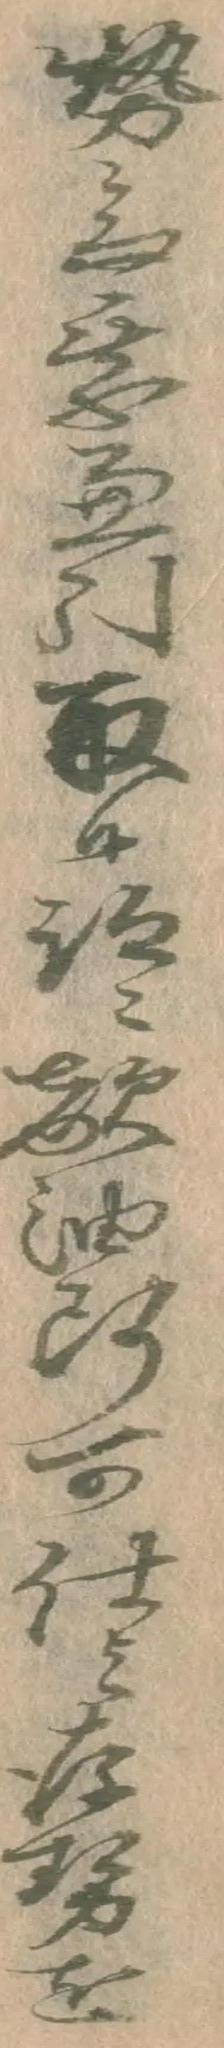勢に而乗兼引取候跡に敵油断可仕与存勢を
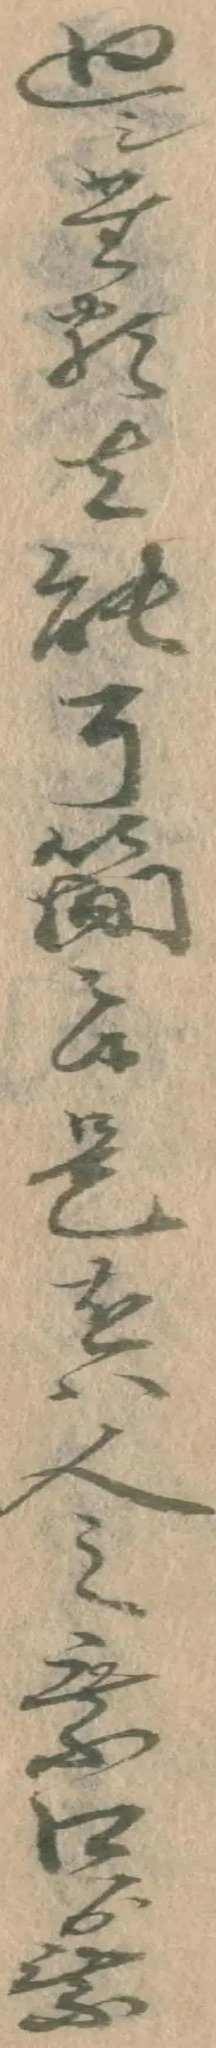廻し堂類者能了簡に候是をは人之乗口ゟ乗
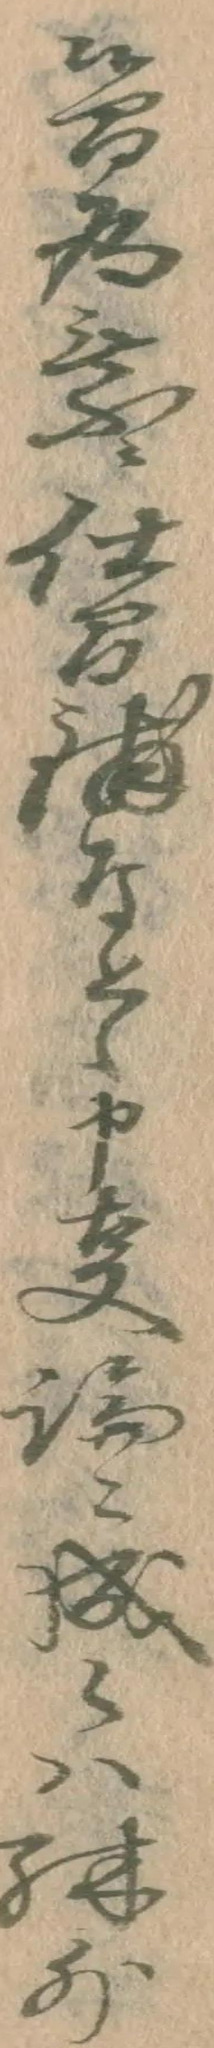候間為乗に仕間鋪なとゝ申事論に成らは殊外
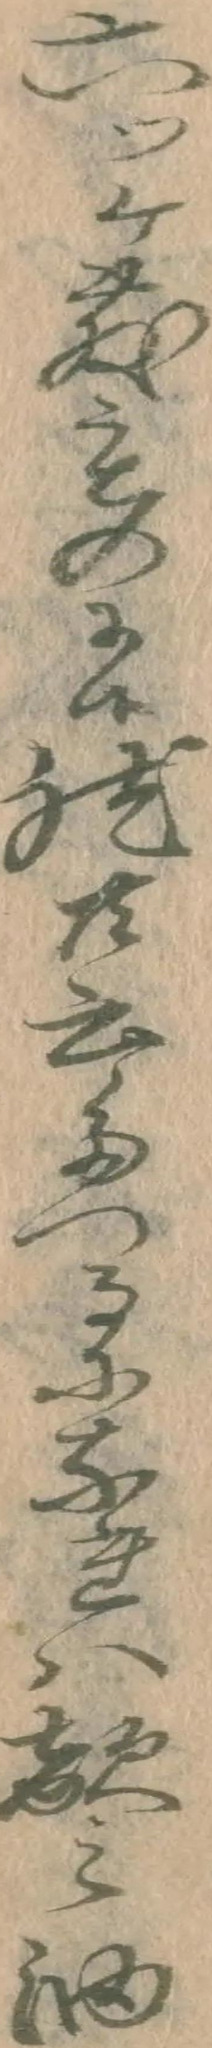六つけ敷もの尓候然共云多つる尓な連は敵之油
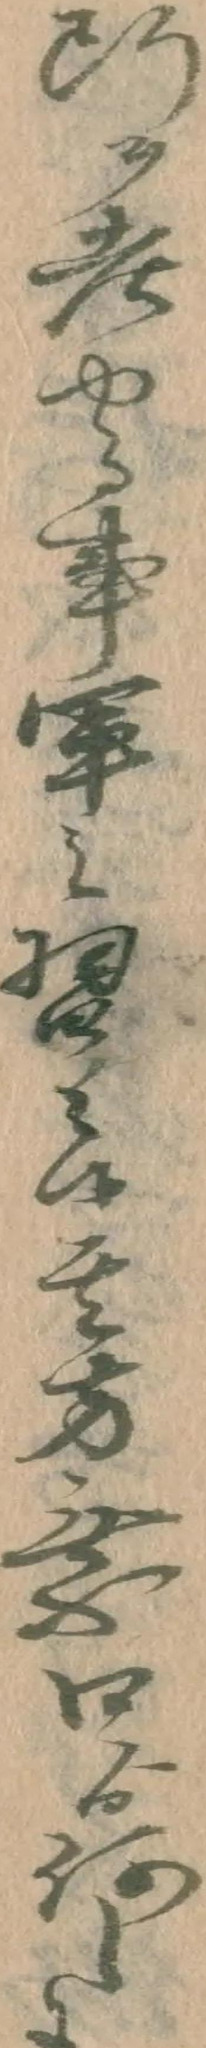断を考ゆる事軍之習に候其方乗口ゟ何し尓
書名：切支丹御退治記 49巻. [8]
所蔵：国立国会図書館 National Diet Library, JAPAN
